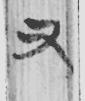又
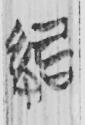{糸己口}
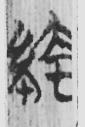䋁
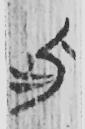此
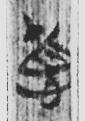惪
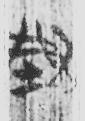型
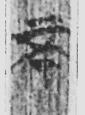不
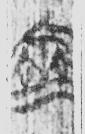齊
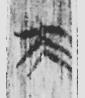夫
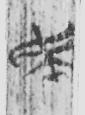民
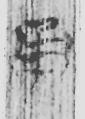甬
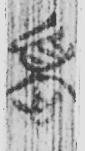𢝊（憂）
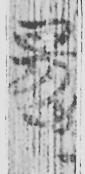愓
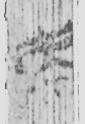民
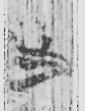之
